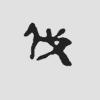伐
